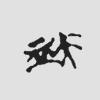{血夨}
